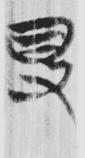𠭁
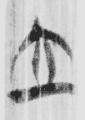立
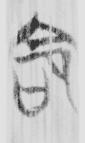命
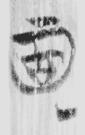固
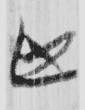臣
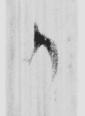人
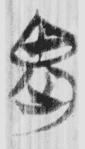畏
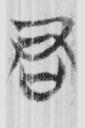君
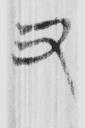又
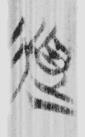道
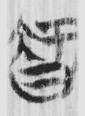智
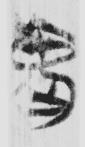畏
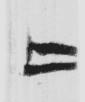亡
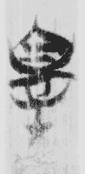辠
